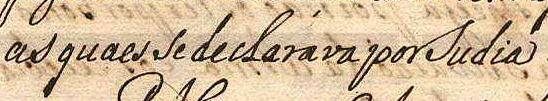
as quaes se declarava por Iudia.
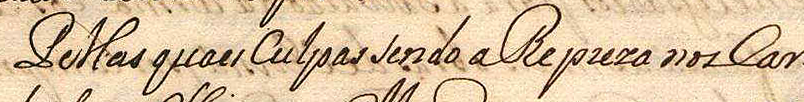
Pellas quaes Culpas sendo a Re preza nos Car
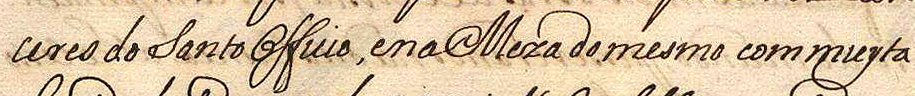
ceres do Santo Officio, e na Meza do mesmo com muyta
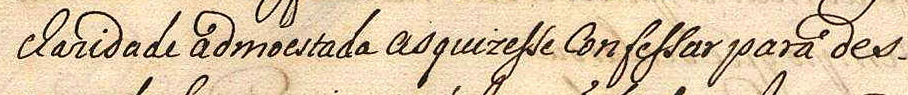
charidade admoestada as quizesse confessar para des
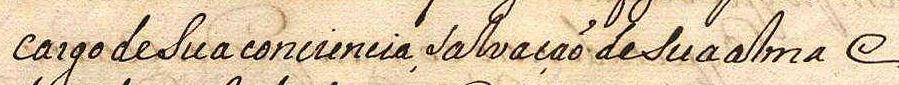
cargo de sua conciencia, salvaçaõ de Sua alma e
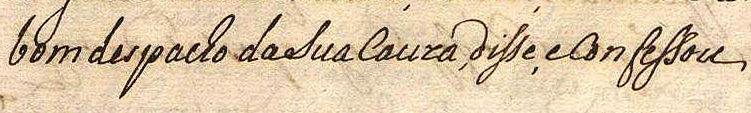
bom despacho da Sua cauza, disse, e confessou,
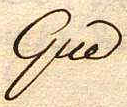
Que
